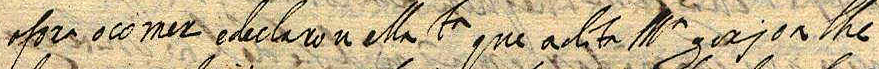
afora o comer e declarou ella ta que a dita Ma gorjoa lhe
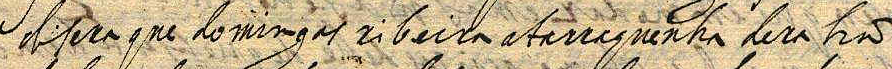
disera que domimgas ribeira a tarraquenha dera hū
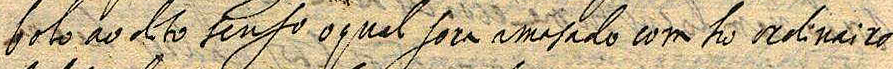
bolo ao dito seu fo o qual fora amasado com ho ordinairo
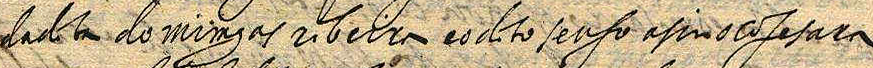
da dita domimgas ribeira e o dito seu fo asim o cōfesara
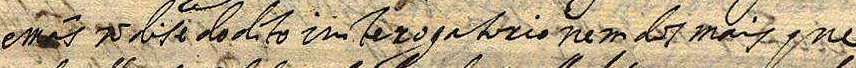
e mais nō dise do dito imterogatorio nem dos mais que
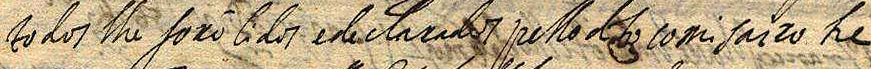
todos lhe forō lidos e declarados pello dito comisairo he
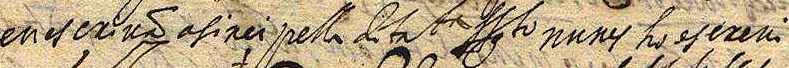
eu escriuā asinei pella dita ta Agto nunes ho escreui
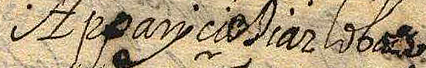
Apparycio Diaz lobato
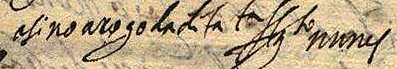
asino a rogo da dita ta Agto nunes
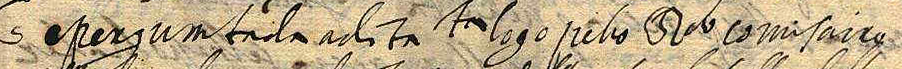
item e pergumtada a dita ta logo pello Rdo comisairo
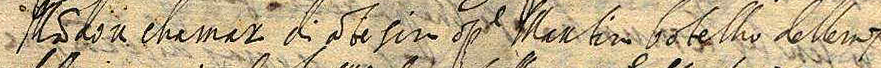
Mādou chamar diāte sim o pe Martim botelho de llemos
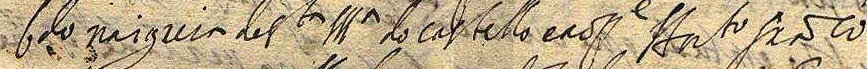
bdo na igreia de sta Ma do castello e ao pe Anto frāco
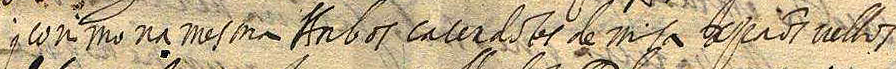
jconimo na mesma Anbos cacerdotes de misa xpaõs uelhos
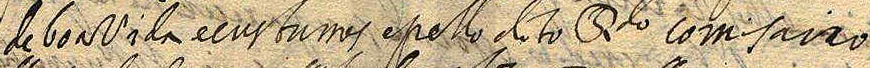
de boa Vida e custumes e pello dito Rdo comisairo
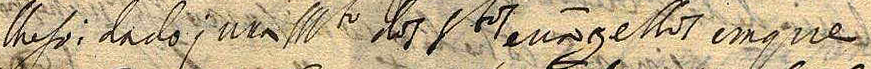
lhe foi dado juraMto dos stos euāgelhos em que
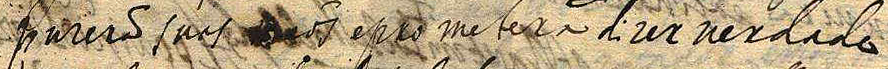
puzerā suas maõs e prometerā dizer uerdade
